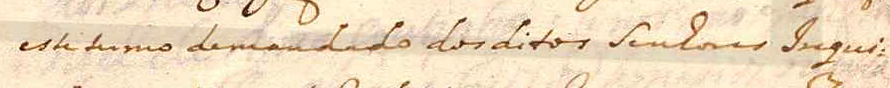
este termo de mandado dos ditos Senhores Inqui
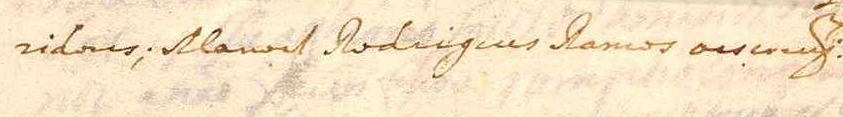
zidores; Manoel Rodrigues Ramos o escreuj.
